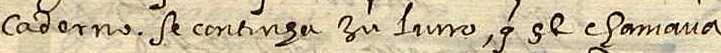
caderno se continha hū liuro, q̄ se chamaua
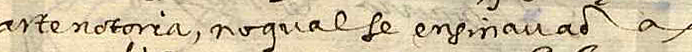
arte notoria, no qual se ensinauaõ as
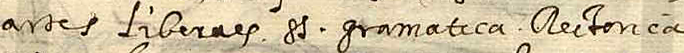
artes Liberaes ss. gramatica Rectorica
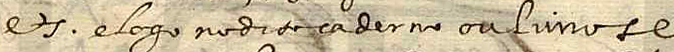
&ꝭ. e logo no dito caderno ou Liuro se
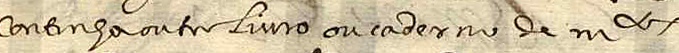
continha outro Liuro ou caderno de mtos
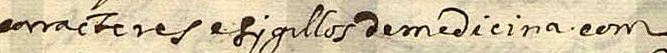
caracteres e sygillos de medicina com
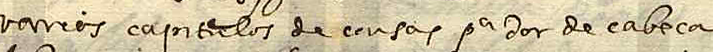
varios capitulos de cousas pa dor de cabeça
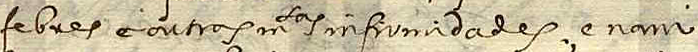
febres e outras mtas infirmidades, e nam
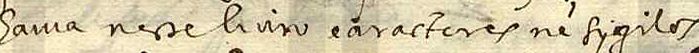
hauia neste liuro caracteres nē sygilos
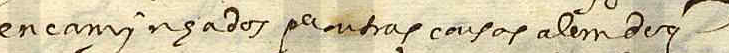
encamynhados pa outras cousas alem do q̄
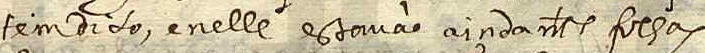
tem dito, e nelle estauaõ ainda mtas folhas
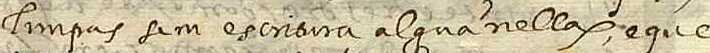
limpas sem escritura alguā nellas, e que
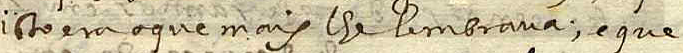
isto era o que mais lhe lembrava; e que
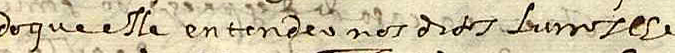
do que elle entendeo nos ditos liuros lhe
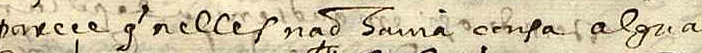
parece q̄ nelles naõ hauia cousa alguā
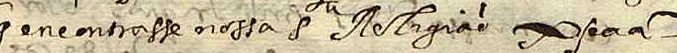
q̄ encontrasse nossa Sta Religiaõ Xpaā
